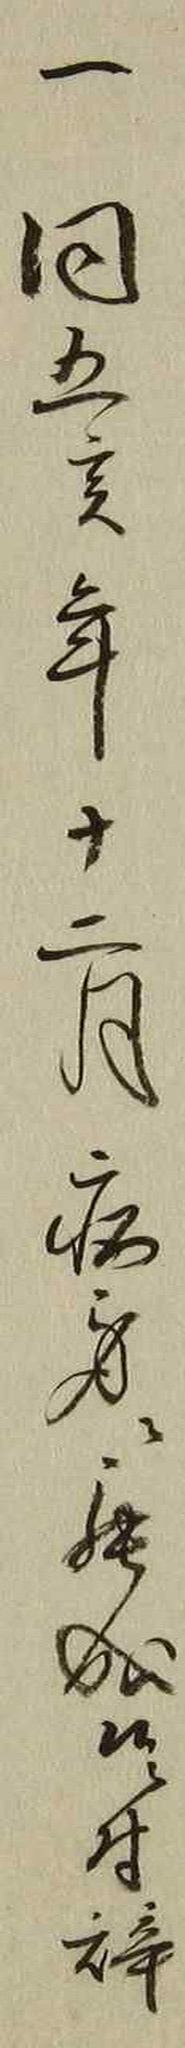一同五亥年十二月病身ニ罷成候ニ付辞
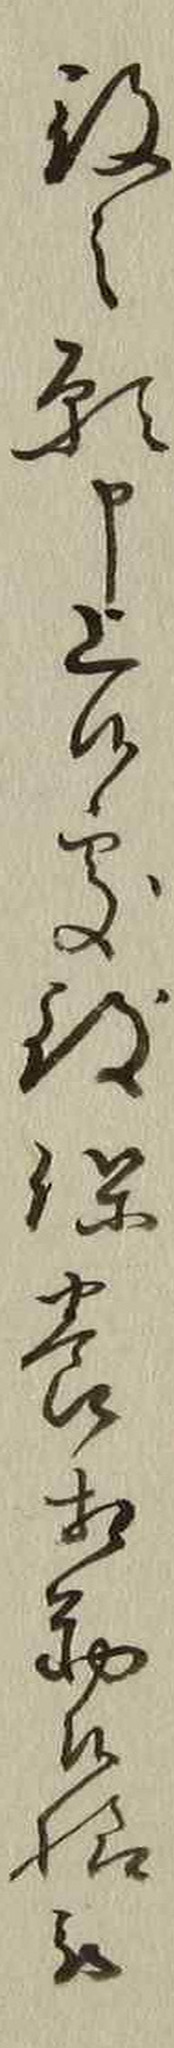致之願申上候処致保養相勤候様被
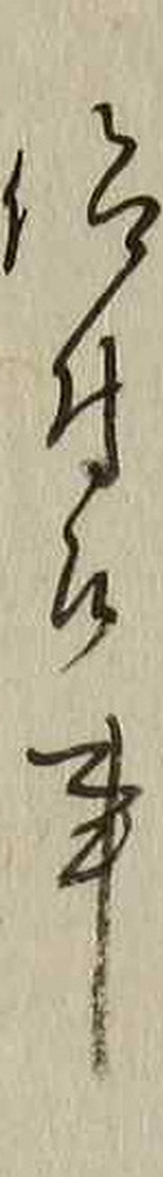仰付候事
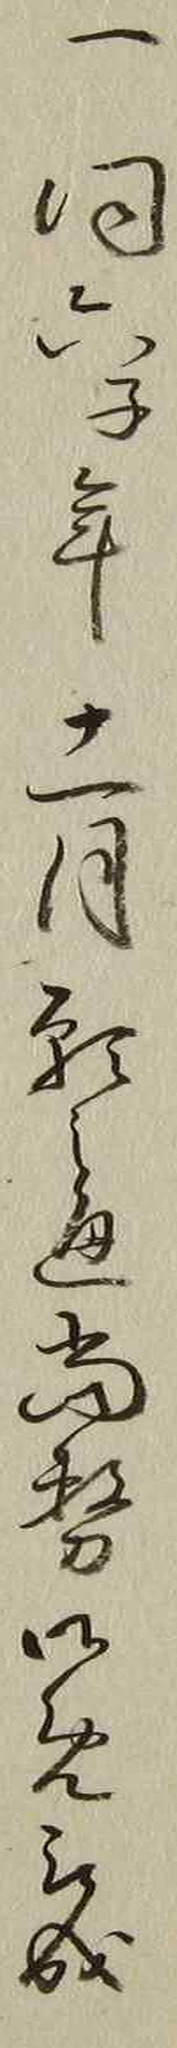一同六子年十一月願之通当務御免被成
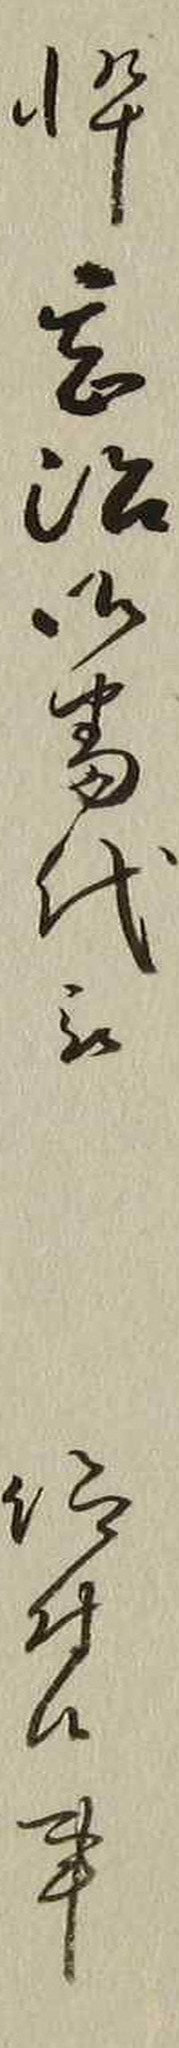忰甚治御番代被仰付候事
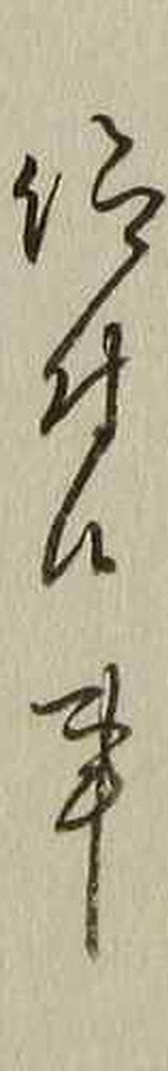仰付候事
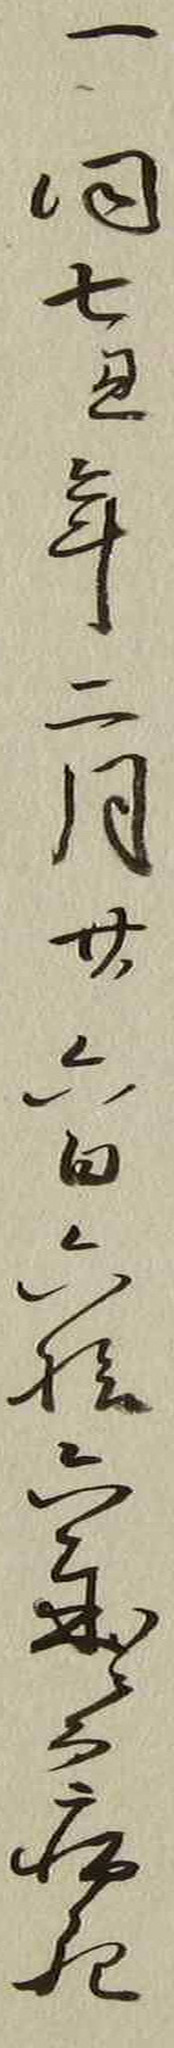一同七丑年二月廿六日六拾六歳ニ而病死
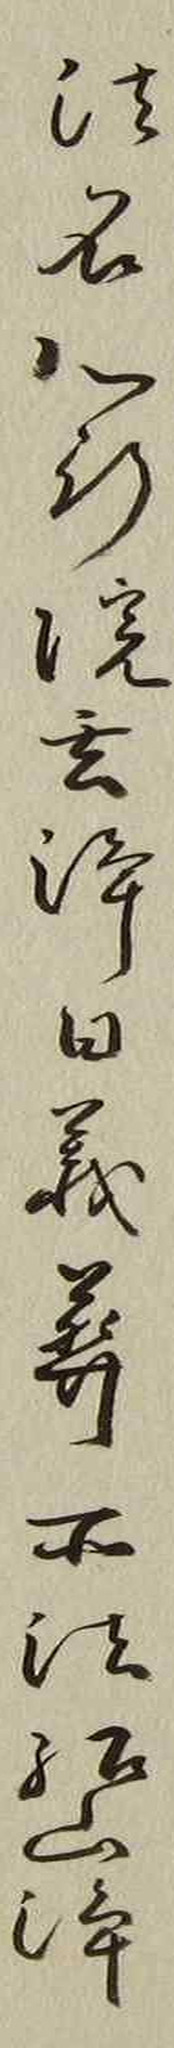法名心行院玄浄日義葬所法紹山浄

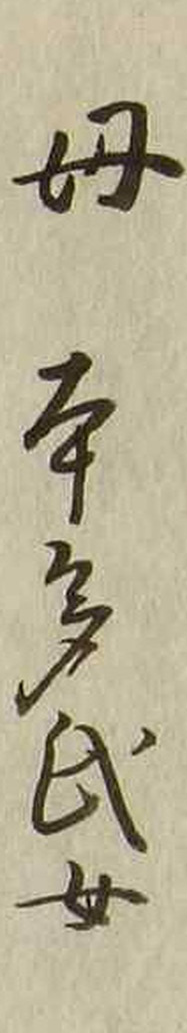母本多氏女
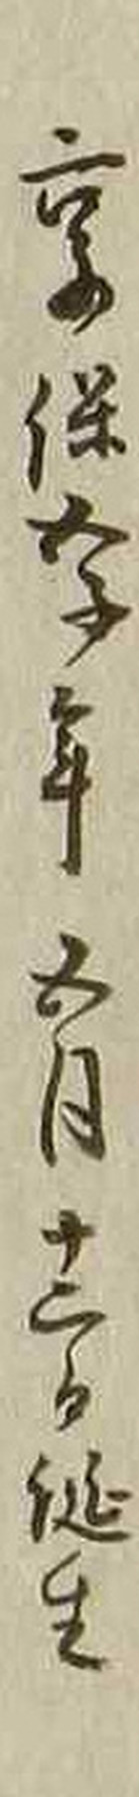享保五子年五月十二日誕生
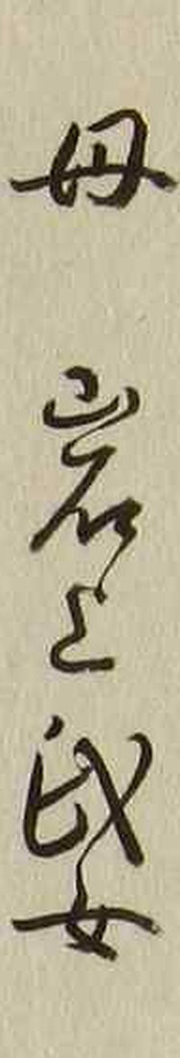母岩上氏女
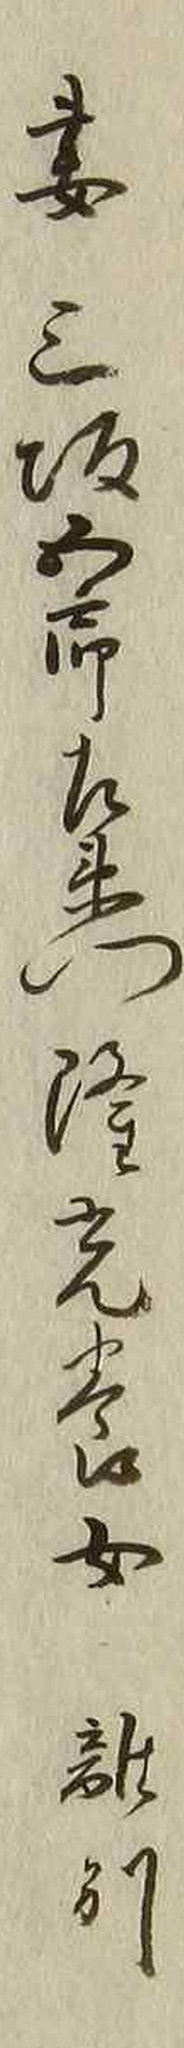妻三坂五郎左衛門隆光養女離別
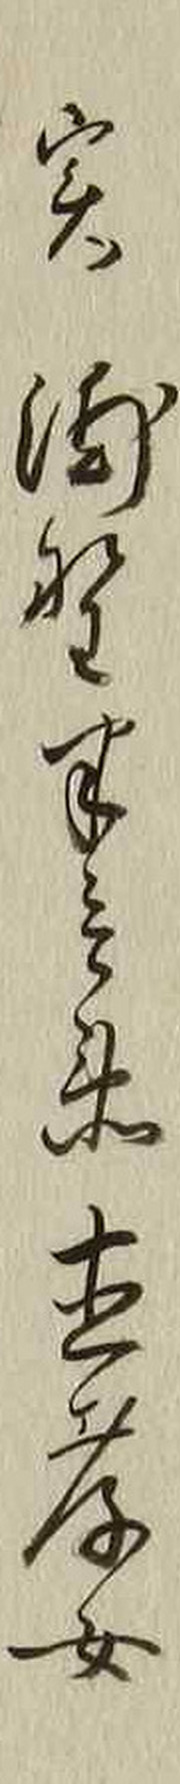実浦野半兵衛直孝女
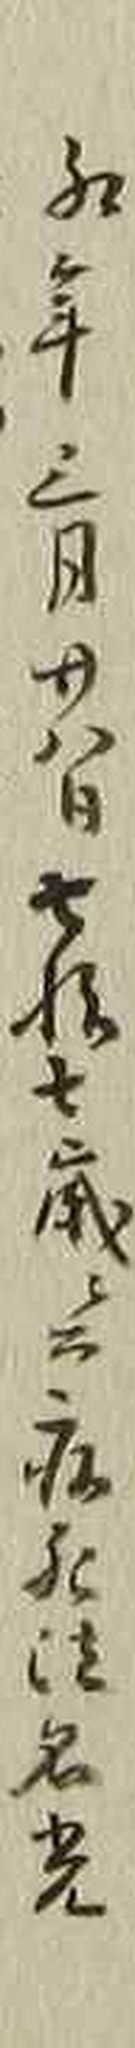卯年三月廿八日七拾七歳ニ而病死法名光
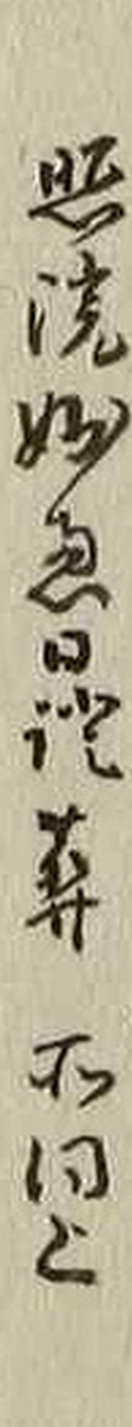照院妙恵日証葬所同上
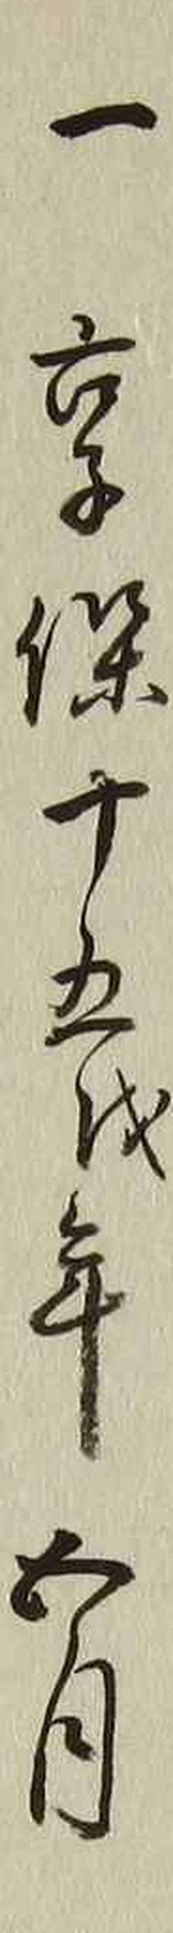一享保十五戌年五月
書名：諸士系譜　巻之4　い之部4
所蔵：会津若松市立会津図書館
